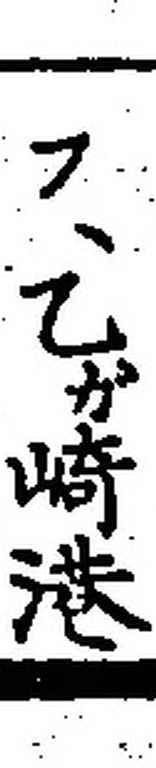フ、乙崎港
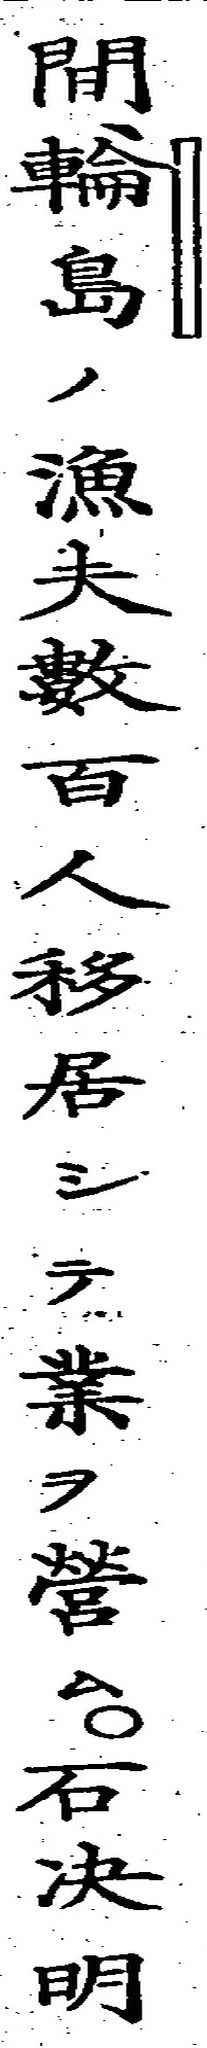間、輪島ノ漁夫数百人移居シテ業ヲ営ム。石決明
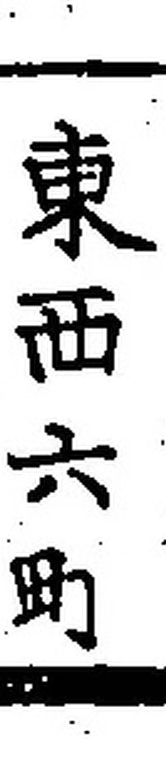東西六町
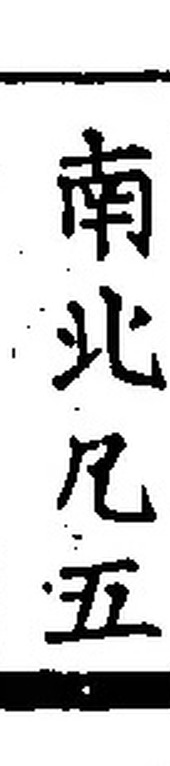南北凡五
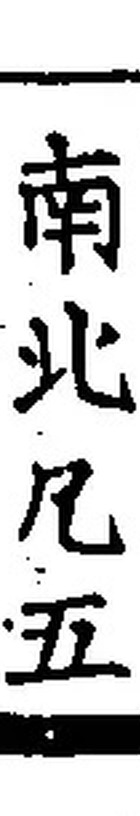南北凡五
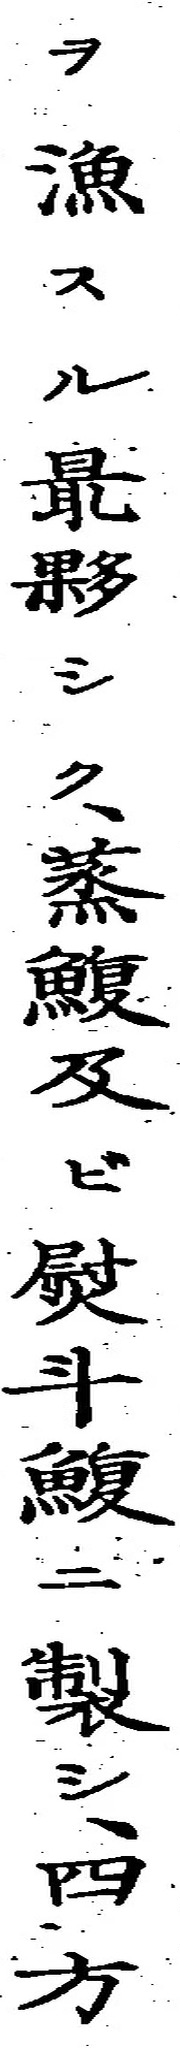ヲ漁スル最夥シク、蒸鰒及ビ熨斗鰒ニ製シ、四方
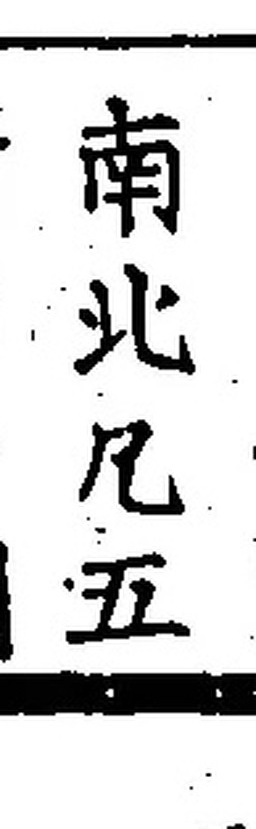南北凡五
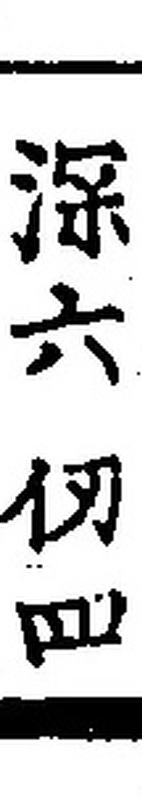深六仞四
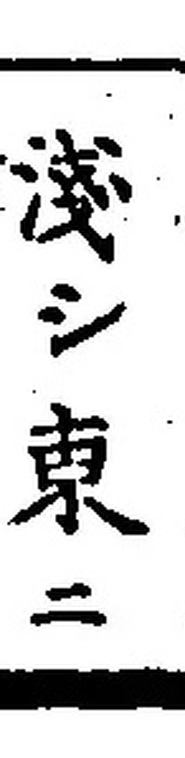浅シ東ニ
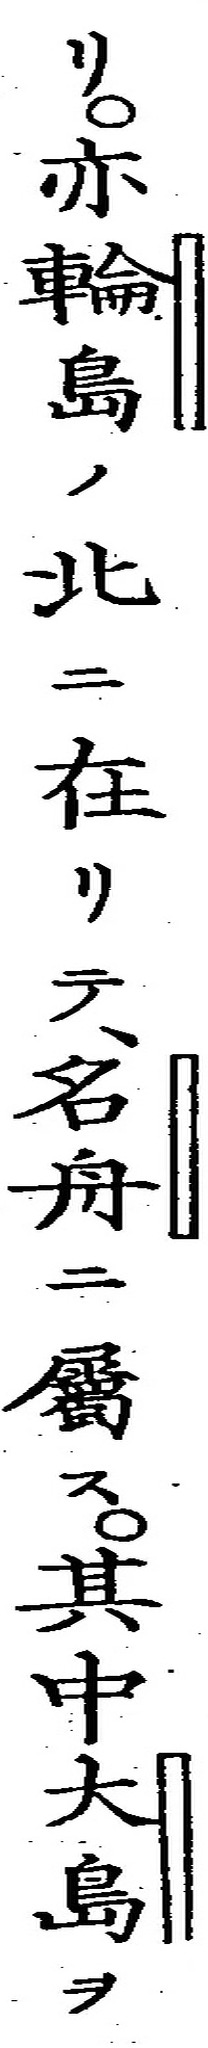リ。亦輪島ノ北ニ在リテ、名舟ニ属ス。其中大島ヲ

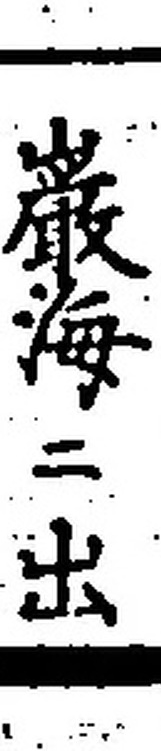巌海ニ出
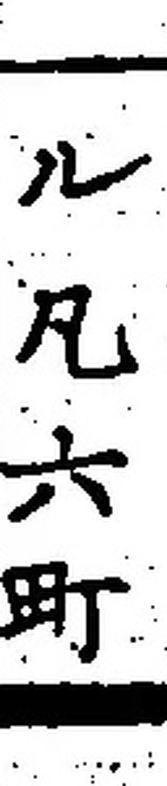ル凡六町
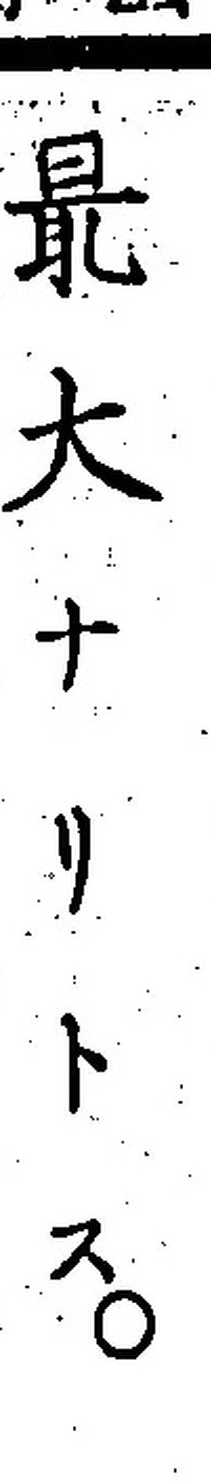最大ナリトス。
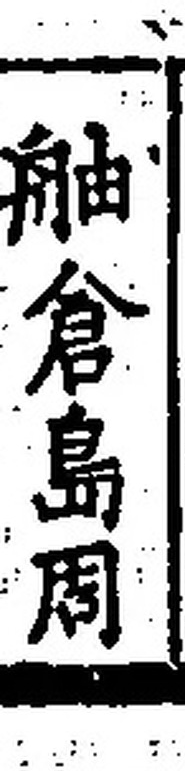舳倉島周
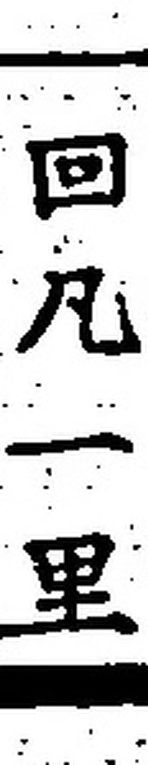回凡一里
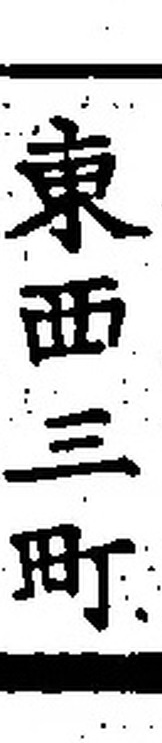東西三町
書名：能登地誌略
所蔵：国立国会図書館 National Diet Library, JAPAN
